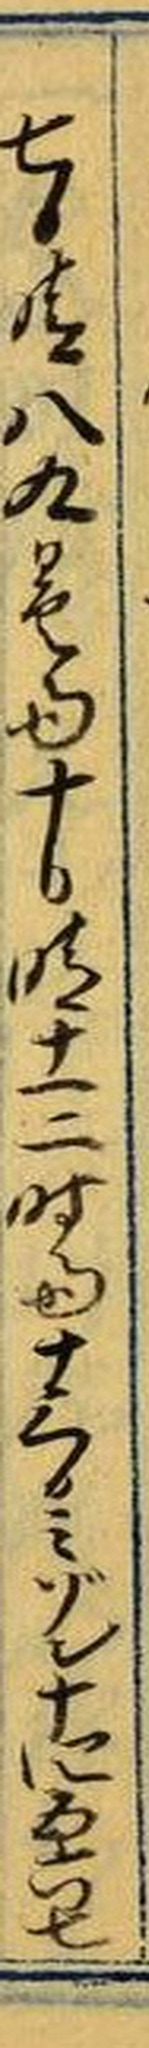七日晴八九曇雨十日晴十一二時雨十三日ミゾレ十四五六七
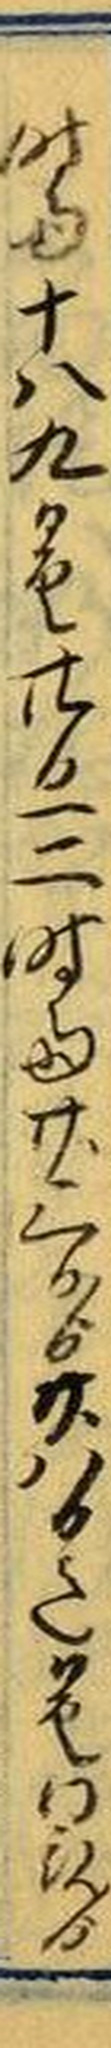時雨十八九曇廿日一二時雨廿三日ゟ廿八日迄曇同夜ゟ
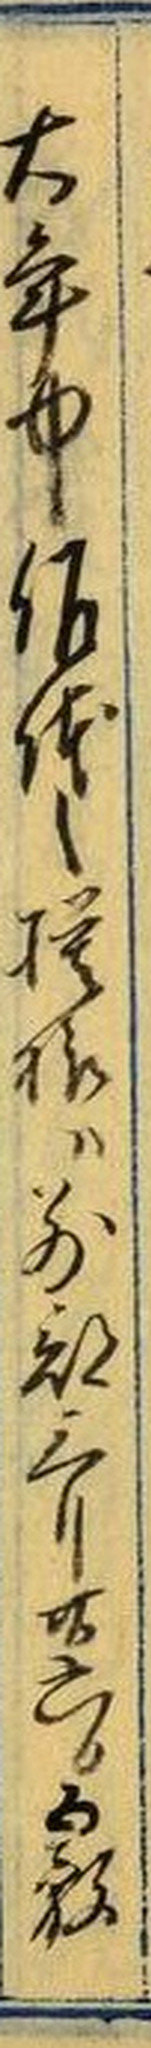右年中作体之模様は別部三月廿六日五穀
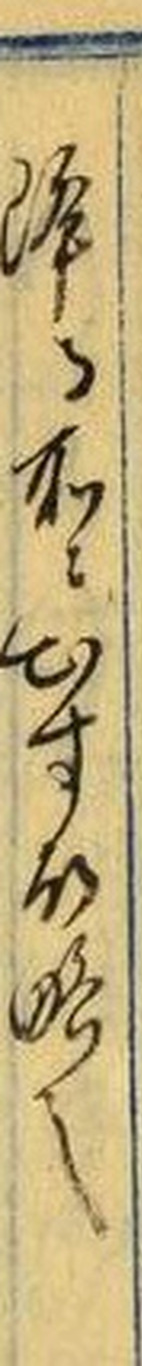降る所に出す故略之

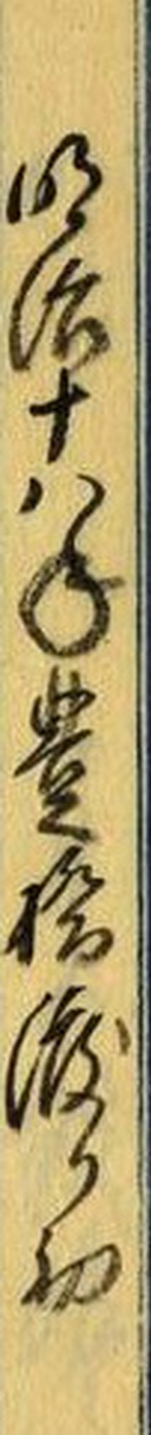明治十八年豊橋渡り初
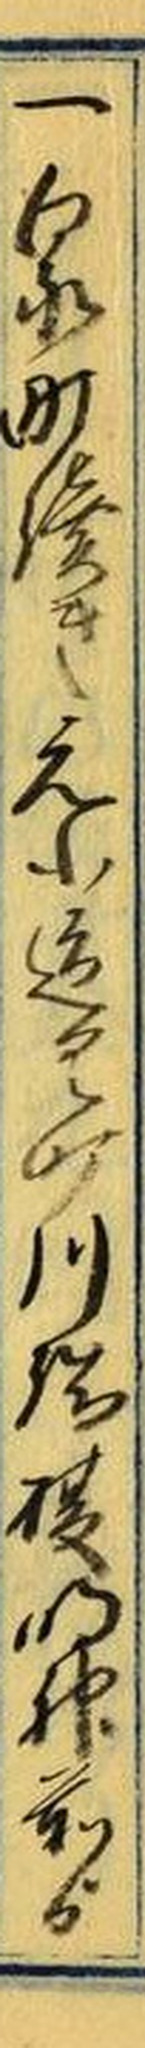一泉町続き元小道具町川端榎明神前ゟ
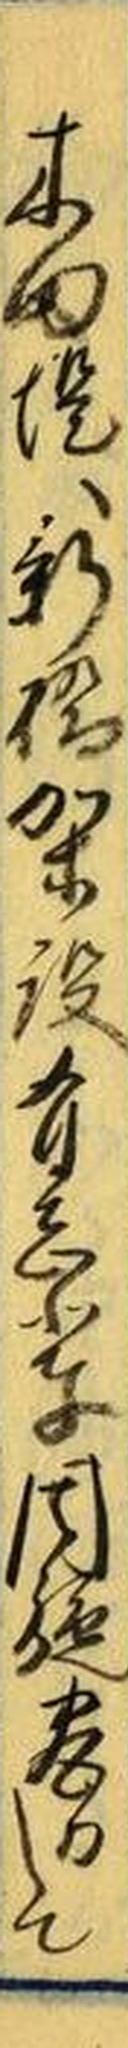木田堤へ新橋架設有志輩周旋尽力して
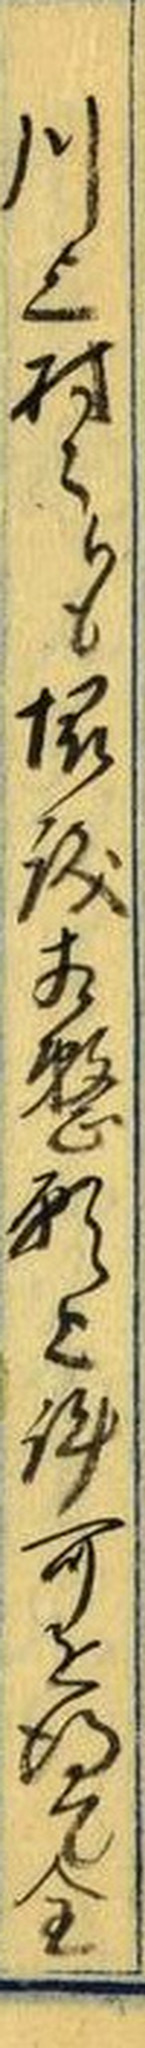川上村々えも協議相整願上許可を得て全
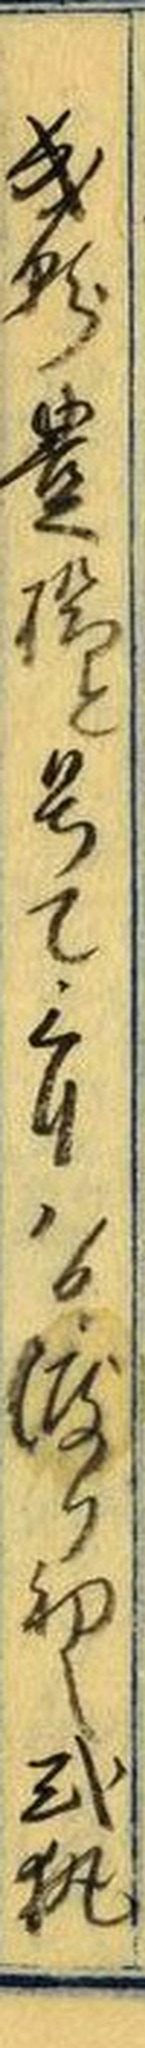成就豊橋と号て三月八日渡り初の式執
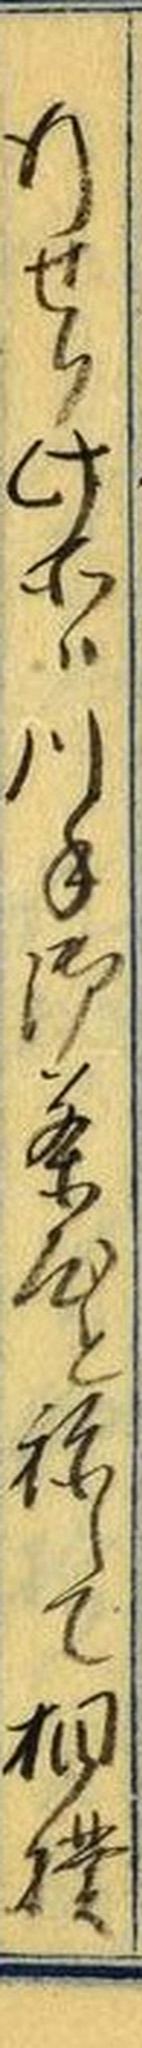行せり此所は川手御茶屋と称して相撲
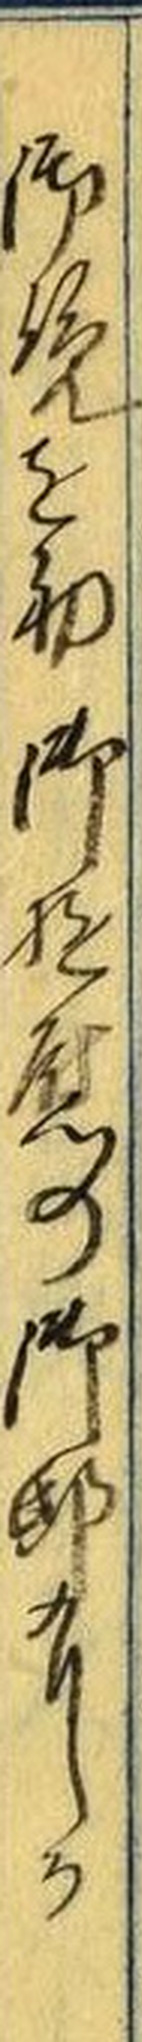御覧を初め御遊慰の御邸有しが
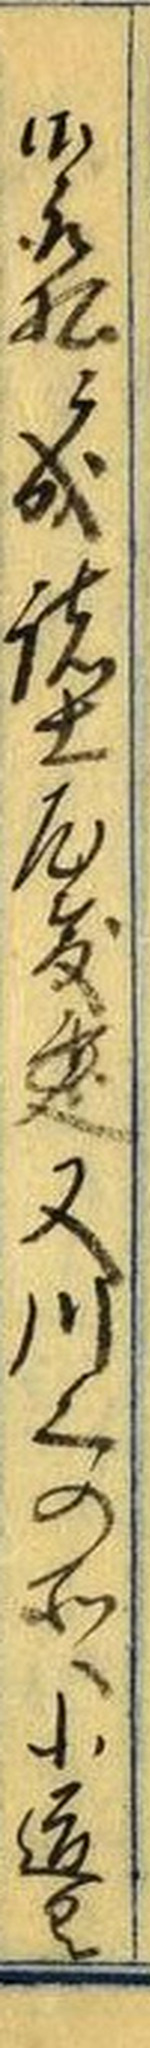御取払に成諸士屋敷建又川上の所へ小道具
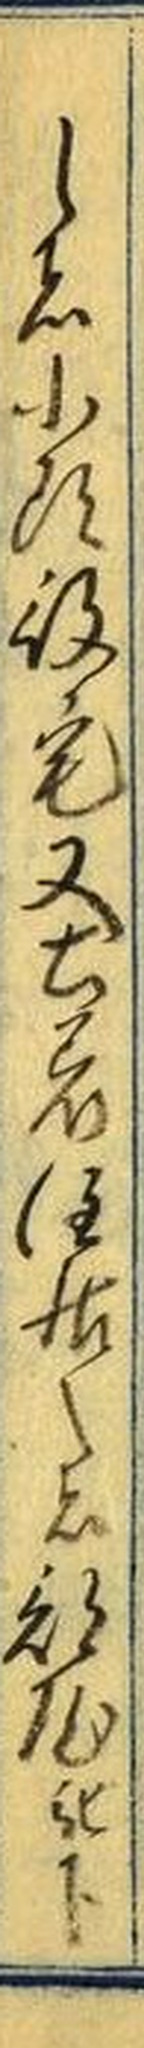之者小頭役宅又土着住居之者部屋被下
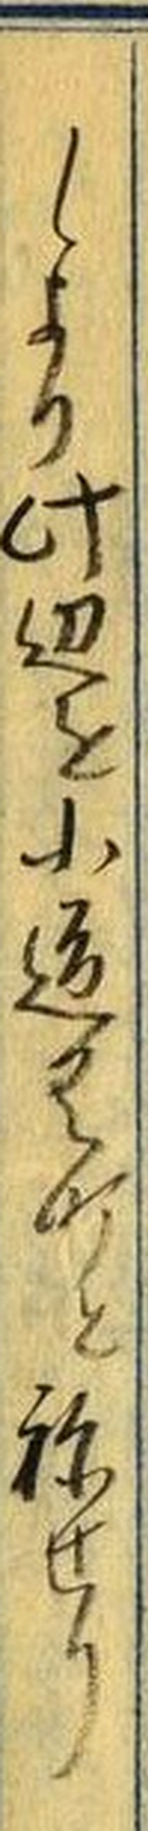しより此辺を小道具町と称せり

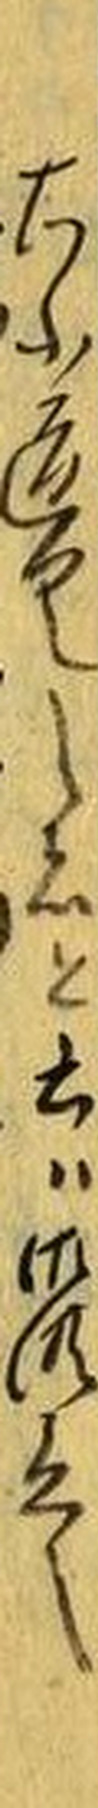右小道具之者と云は御供者之
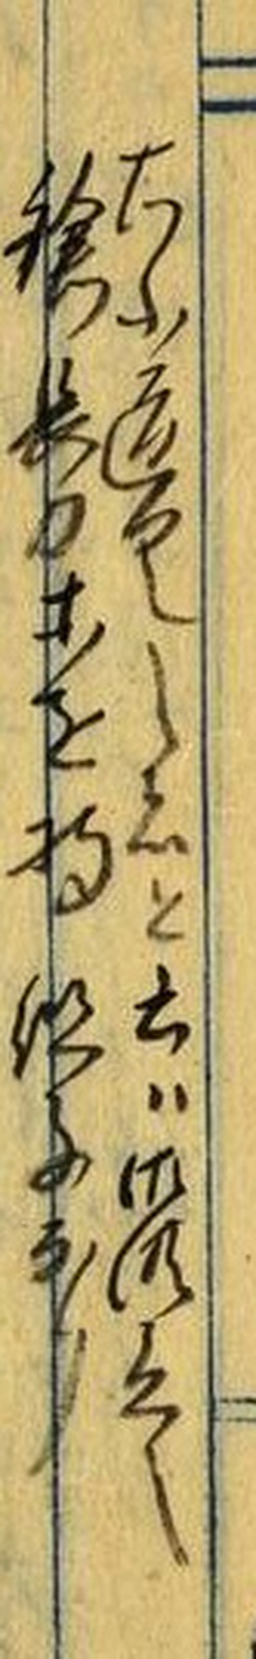鎗長刀等を持組子なり
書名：温古集 五巻
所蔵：福井県文書館 Fukui Prefectural Archives
